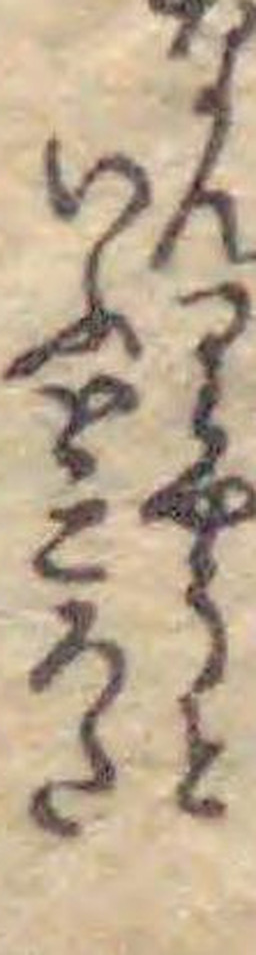いふところた
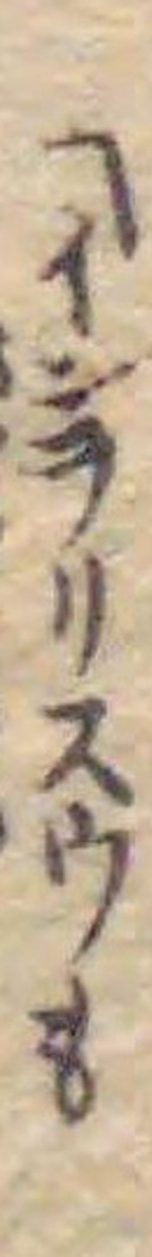〽インヲリスウも
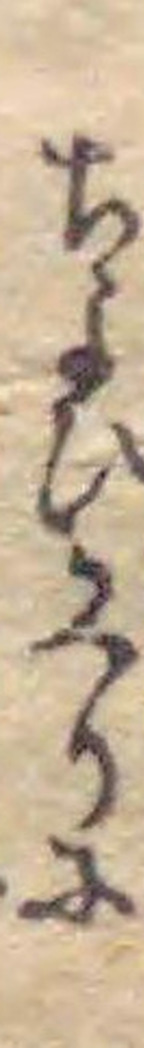ちよひかへりに
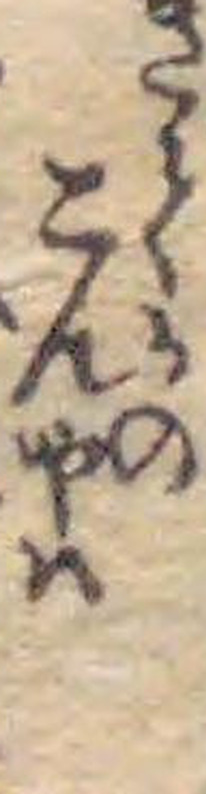こんやは
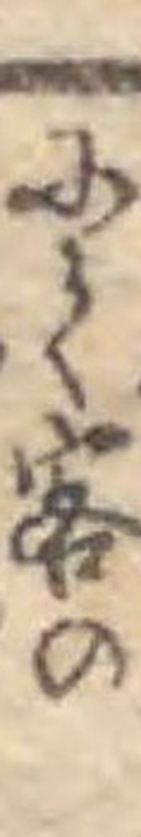にて客の
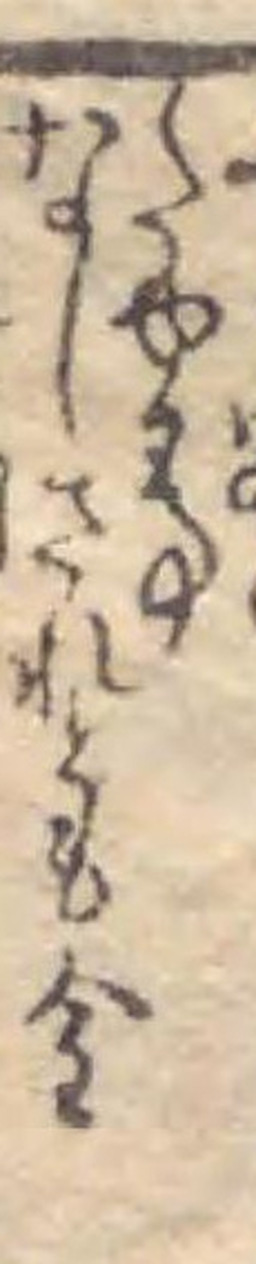なしされとも金
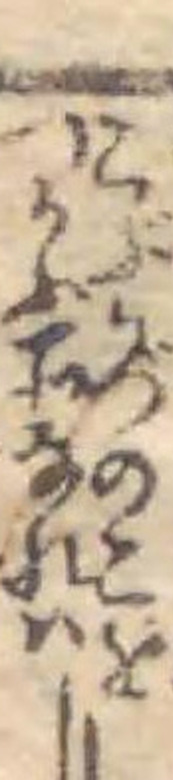こぶかづのこを
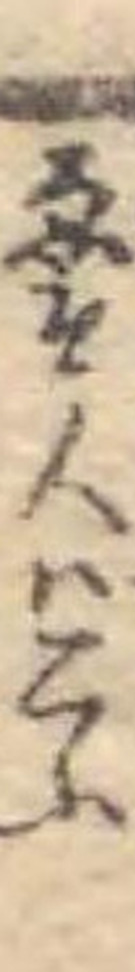ゑそ人はこふ
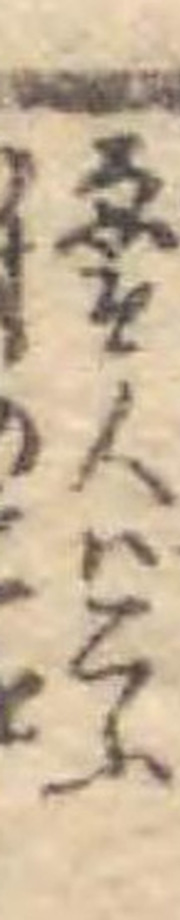ゑそ人はこふ
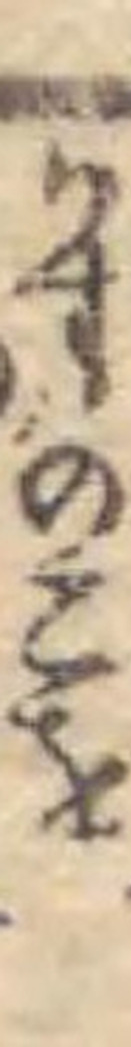かすのこを
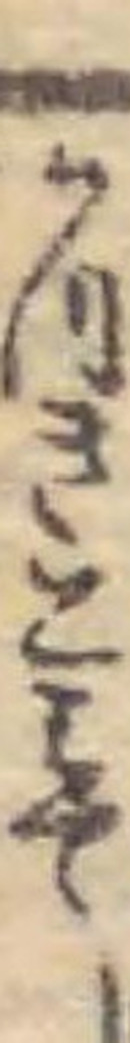かつきこみて
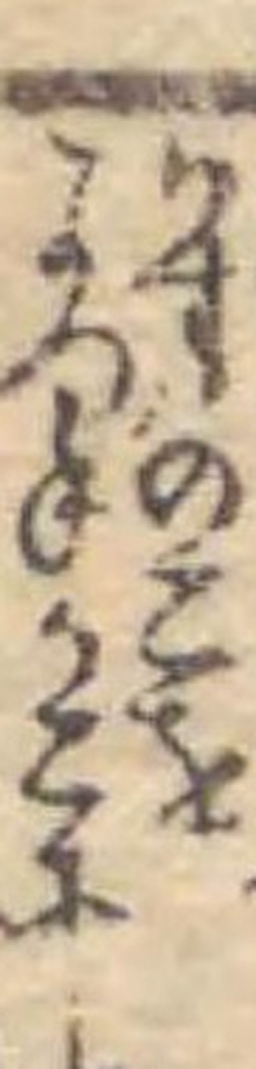よつ手かこに
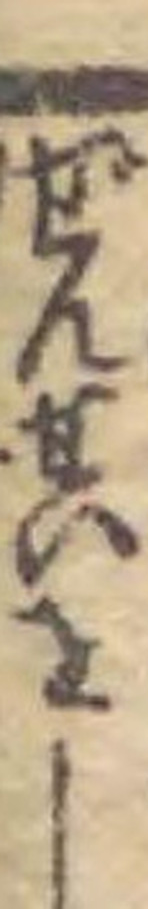ぜんせいを
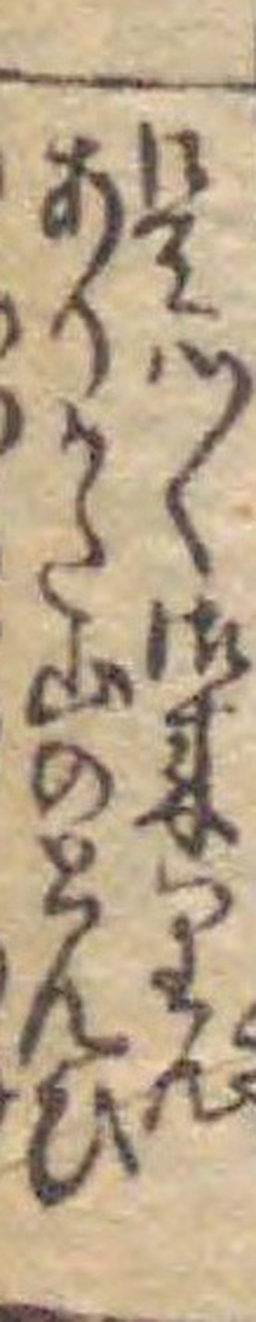ありかた山のとんひ
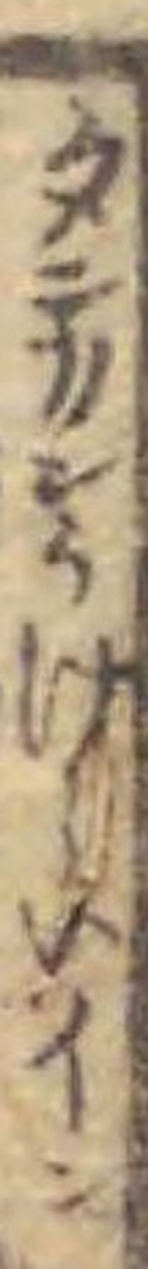タンカンかけらいイン
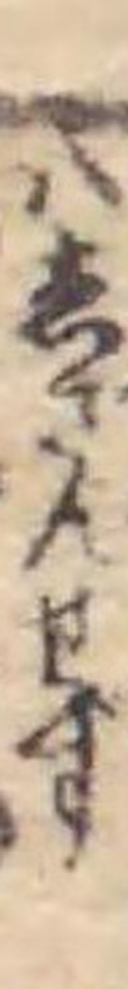はしさんせず
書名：悦贔負蝦夷押領 : 3巻
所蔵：国立国会図書館 National Diet Library, JAPAN
